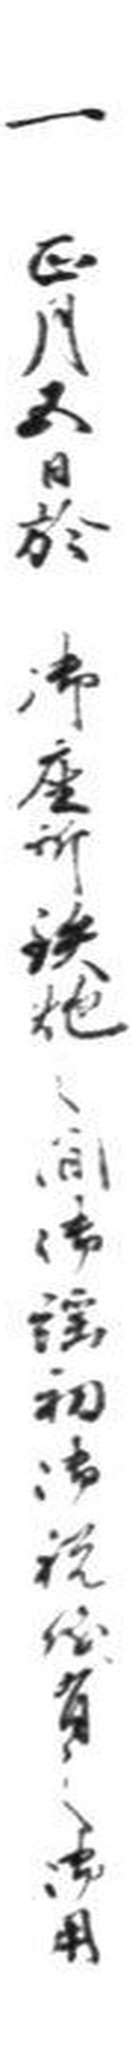一正月五日於御座所鉄炮之間御謡初御祝儀有之御用
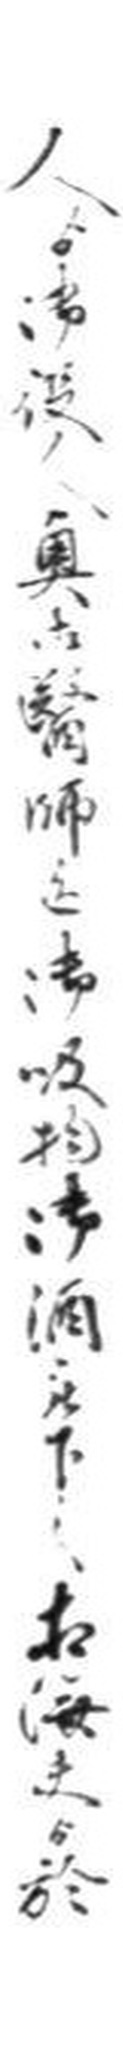人ゟ御役人奥御医師迄御吸物御酒被下之相済夫ゟ於
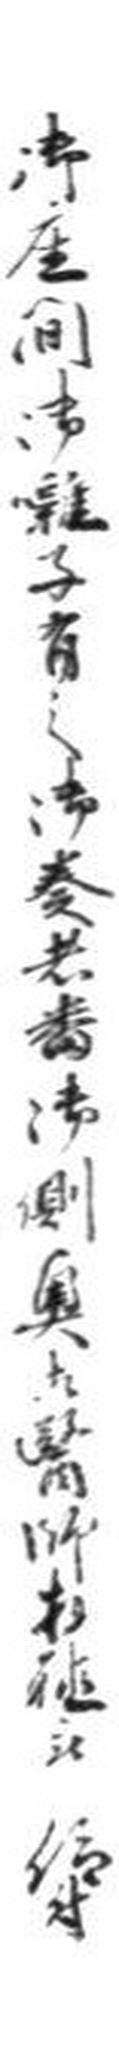御座間御囃子有之御奏者番御側奥御医師拝聴被仰付
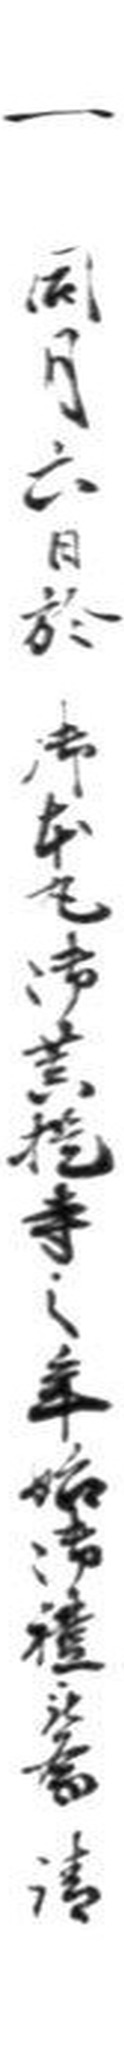一同月六日於御本丸御菩提寺之年始御礼被為請
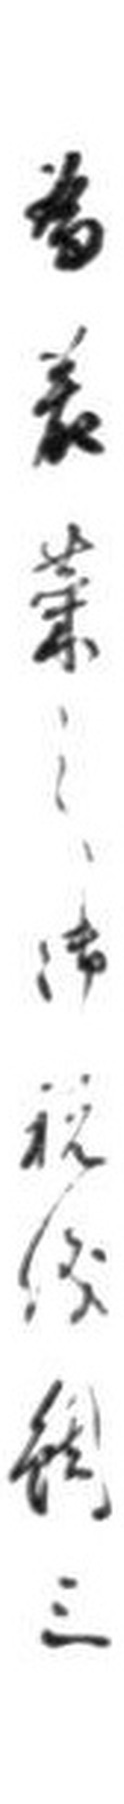為若菜之御祝儀鯛三
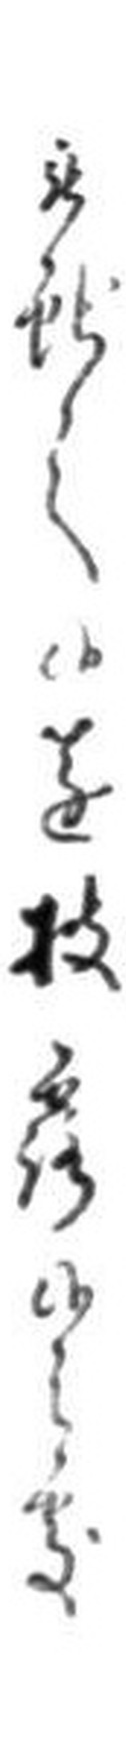被献之候遂披露候之処
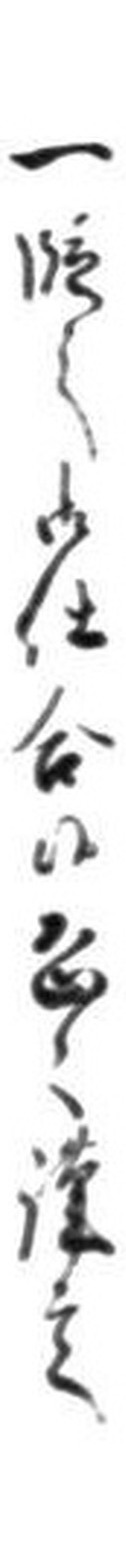一段之御仕合候恐々謹言
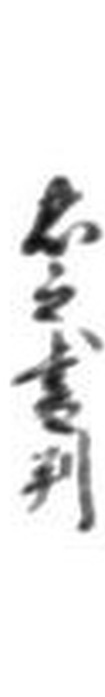忠之書判
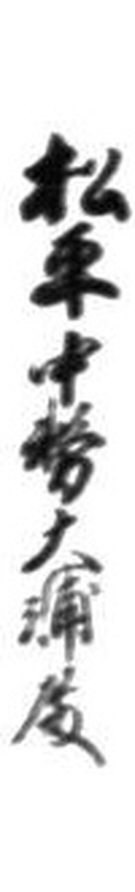松平中務大輔殿
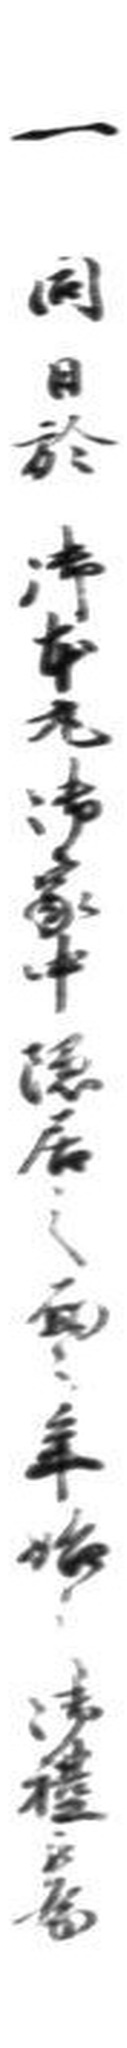一同日於御本丸御家中隠居之面々年始之御礼被為
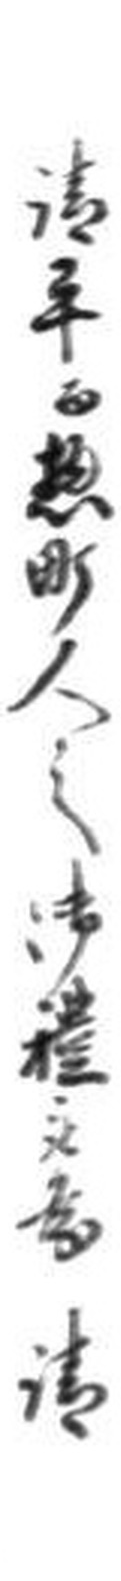請畢而惣町人之御礼被為請
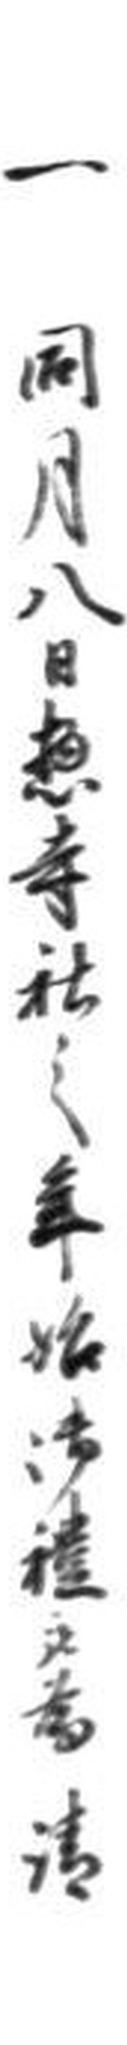一同月八日惣寺社之年始御礼被為請

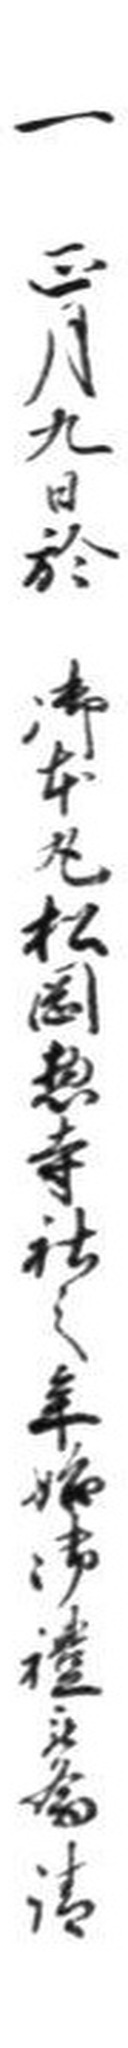一正月九日於御本丸松岡惣寺社之年始御礼被為請
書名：家譜 三十六 宗昌公 従享保八年到同九年
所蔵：福井県文書館 Fukui Prefectural Archives
